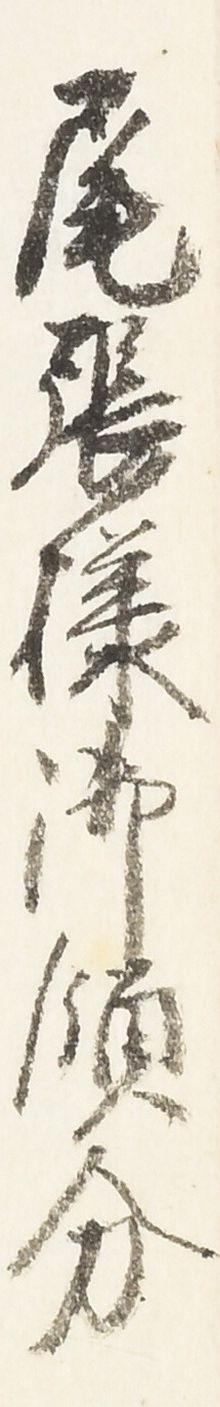尾張様御領分
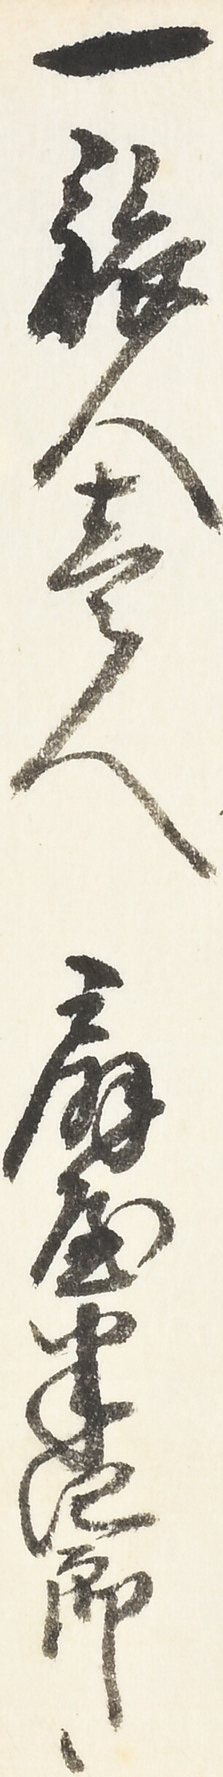一旅人壱人扇屋半四郎・
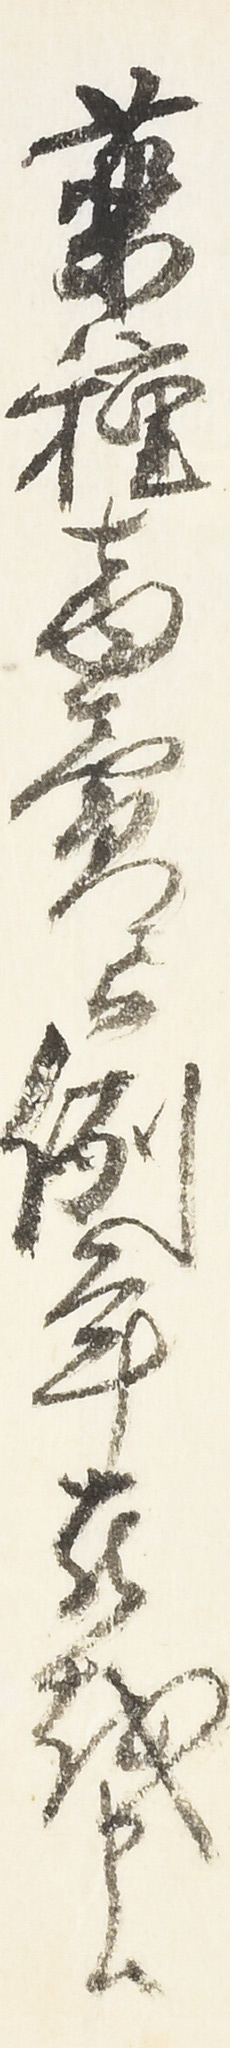薬種商売ニ而例年罷越申候
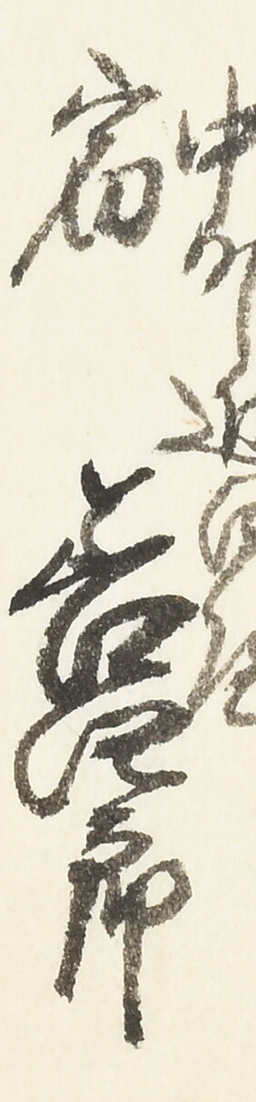宿善四郎
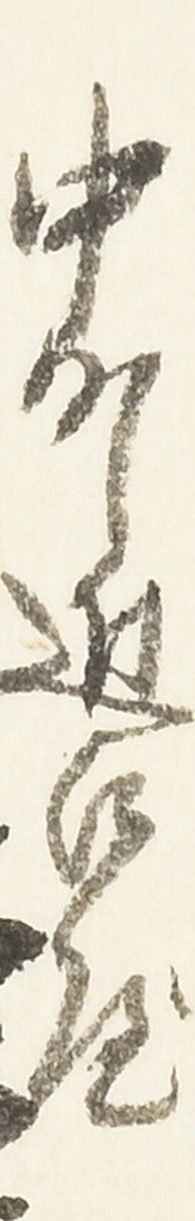中町近江屋
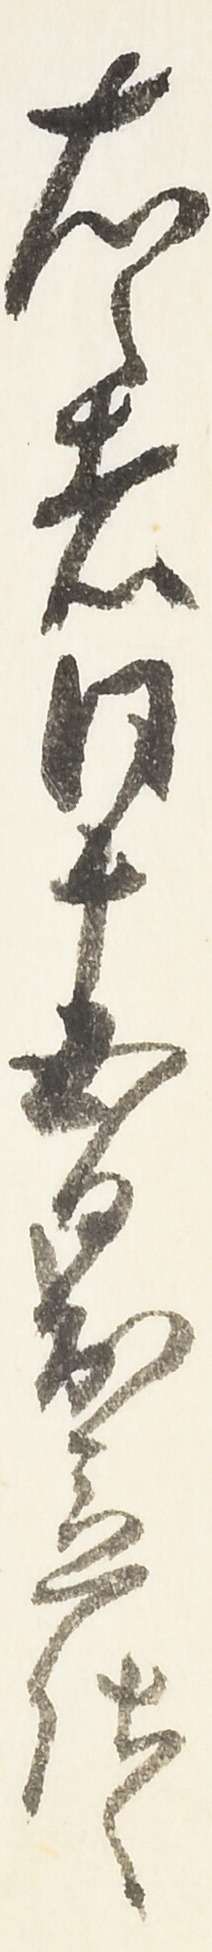右之者同十五日出立仕候
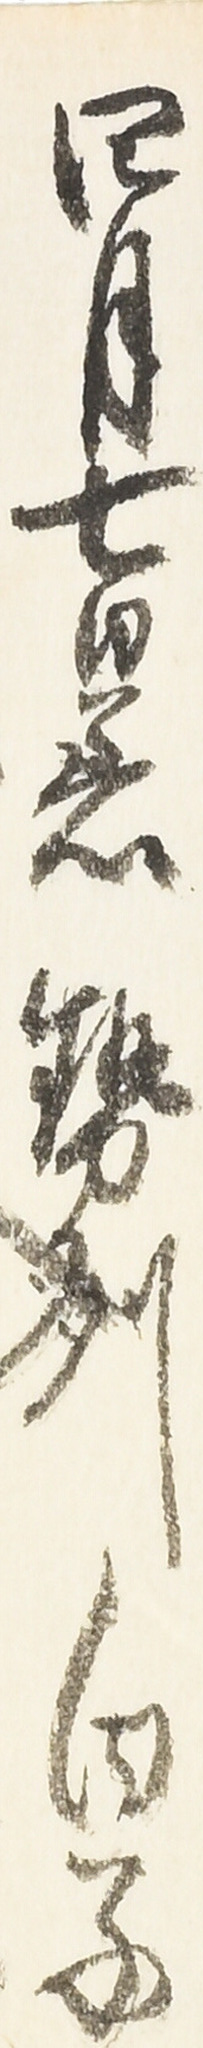四月七日着勢州白子
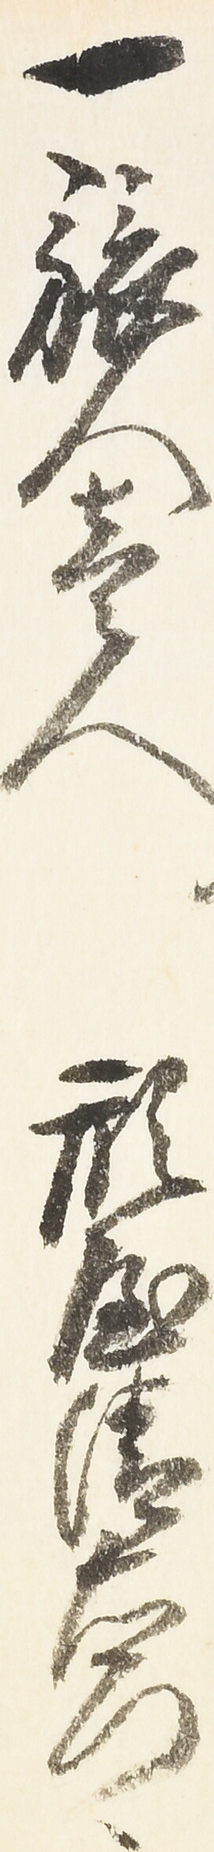一旅人壱人形屋清右衛門・
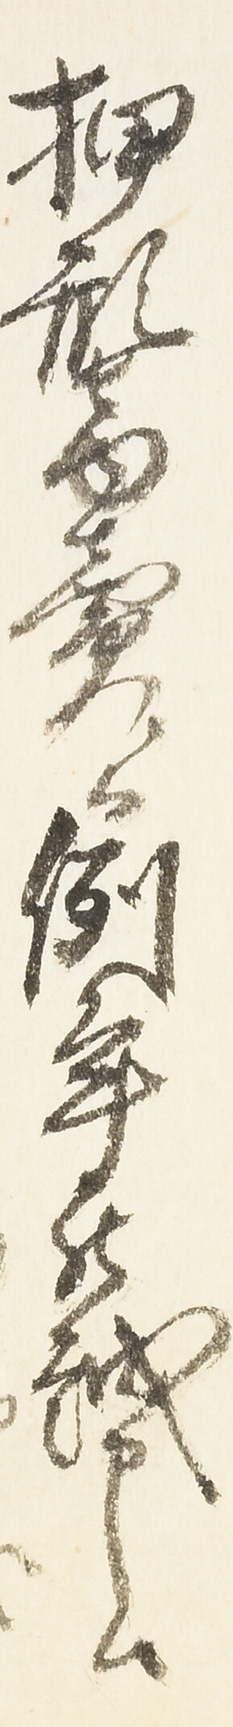押形商売ニ而例年罷越申候
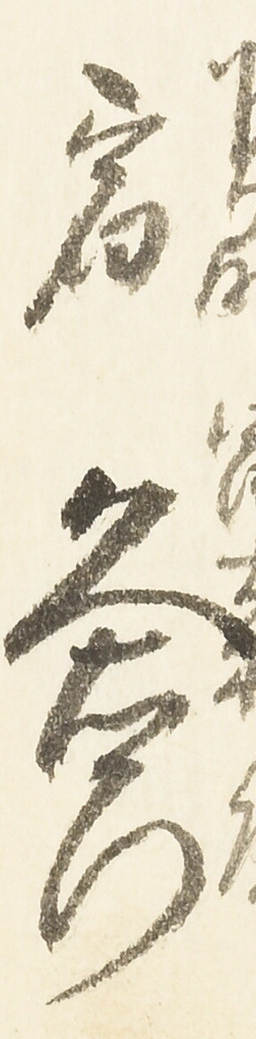宿久右衛門
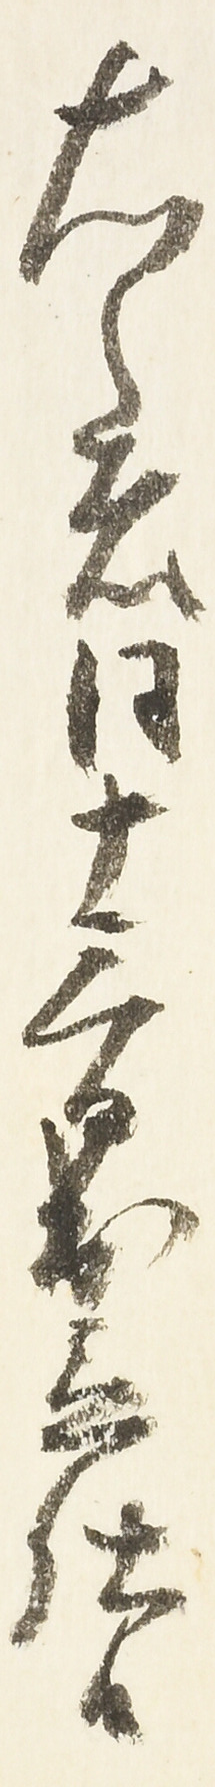右之者同十三日出立仕候
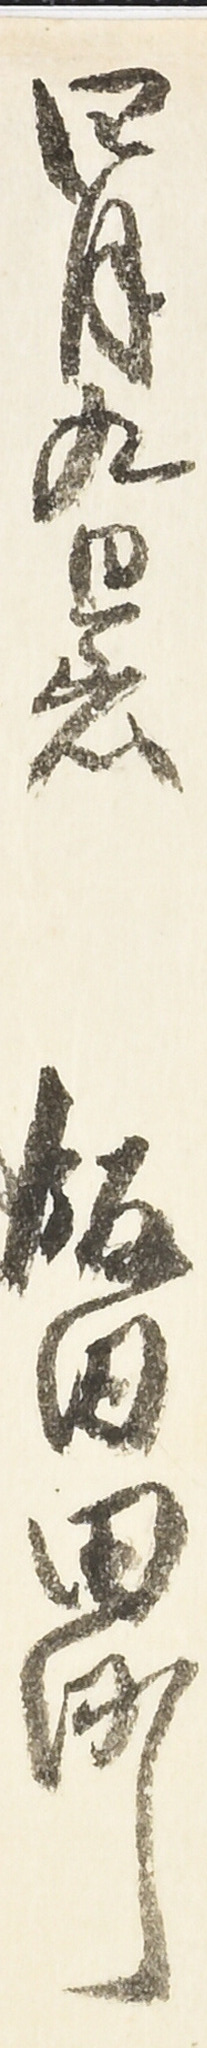四月九日着飯田田町
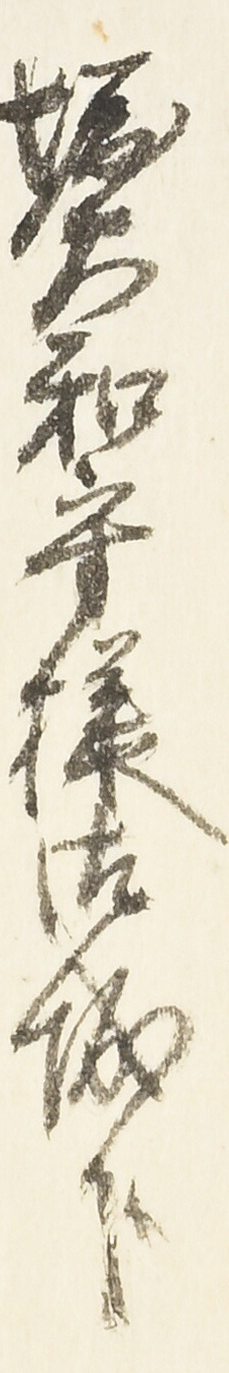堀大和守様御城下
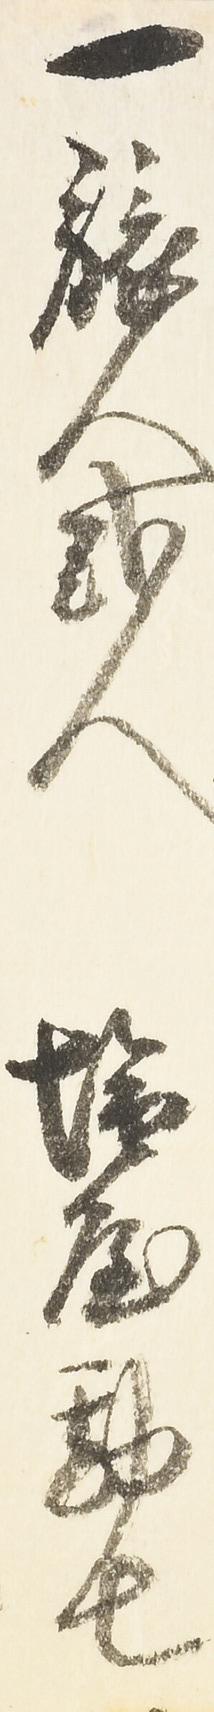一旅人弐人塩屋勘七・
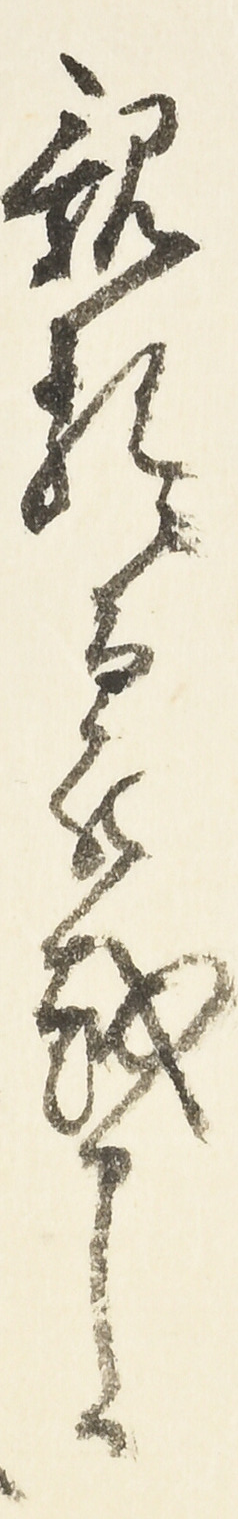親類ニ而罷越申候
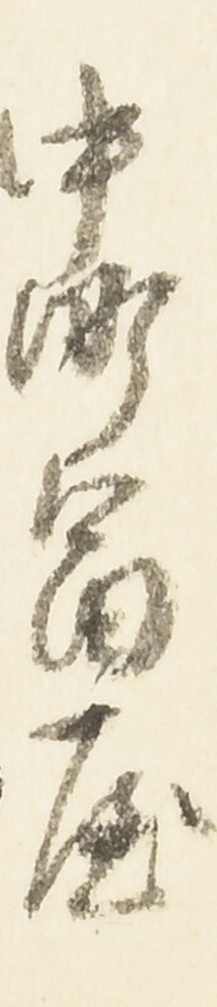中町冨屋
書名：町中旅人泊控帳
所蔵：伊那市立高遠町図書館・合同会社AMANE
